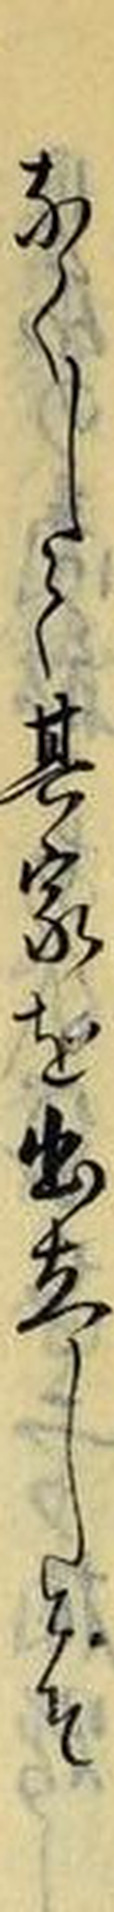なくして其家を出立しとそ
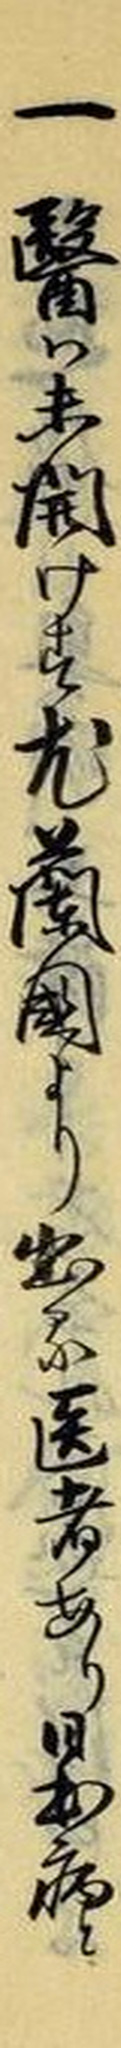一医ハ未開けす尤蘭国より出る医者あり日本病と
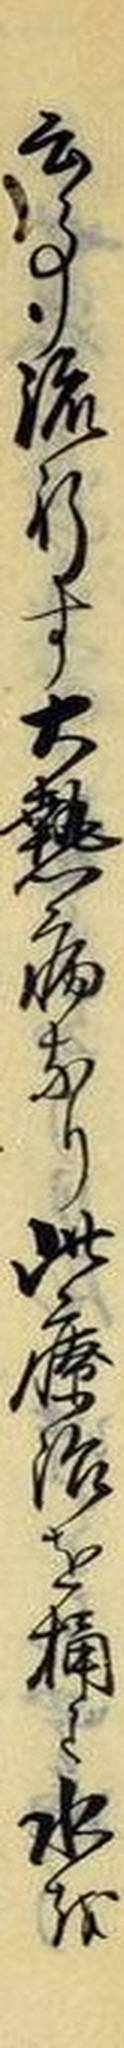云事流行す大熱病なり此療治を桶に水を
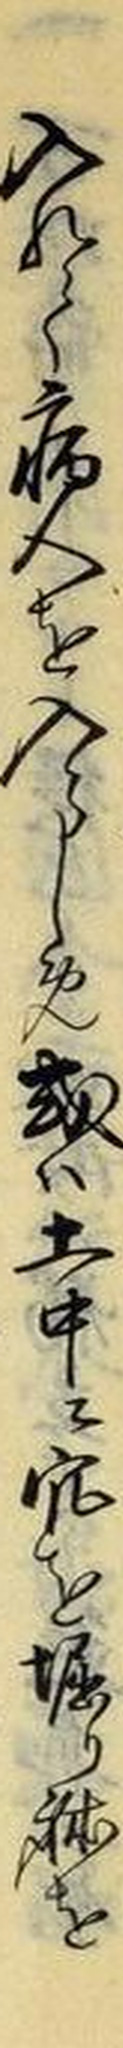入れて病人を入らしめ或いハ土中ニ穴を掘り体を
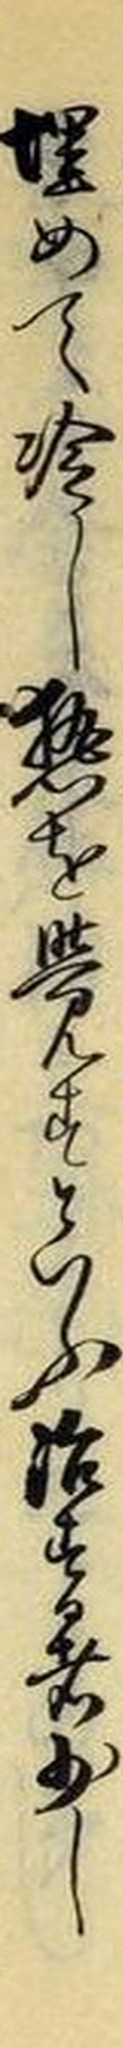埋めて冷し熱を覚すといふ治する者少し
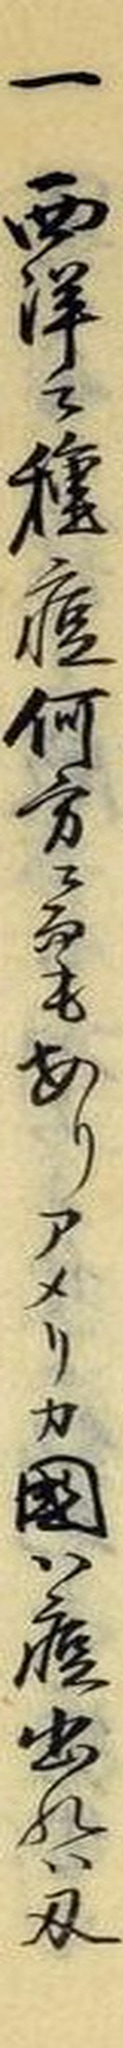一西洋ニ種痘何万ニ而もありアメリカ国ハ痘出れハ刃
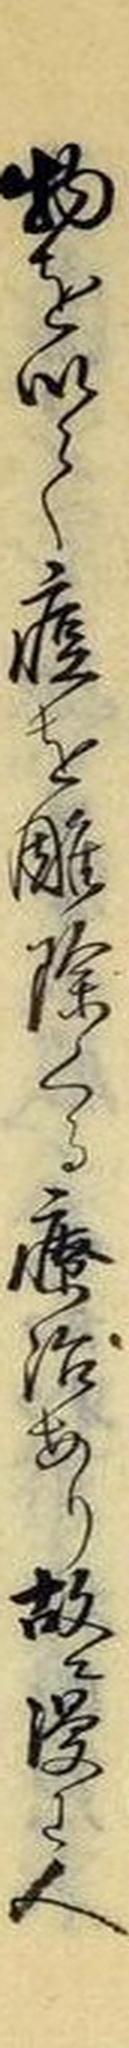物を以て痘を雕除くる療治あり故ニ侵に人
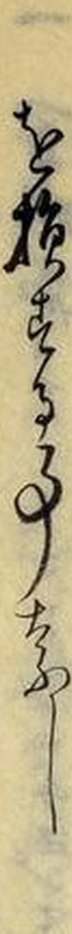を損する事なし
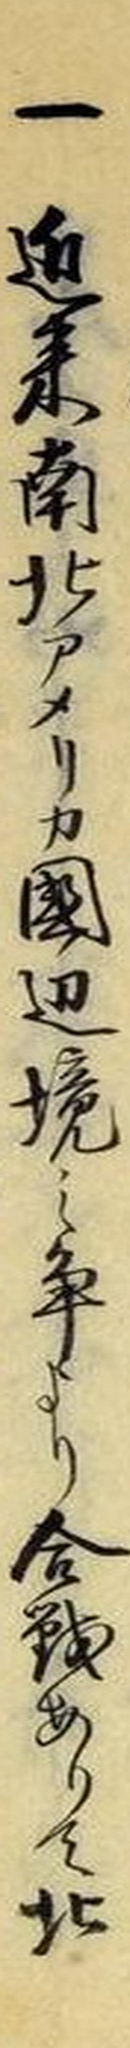一近来南北アメリカ国辺境の争より合戦ありて北
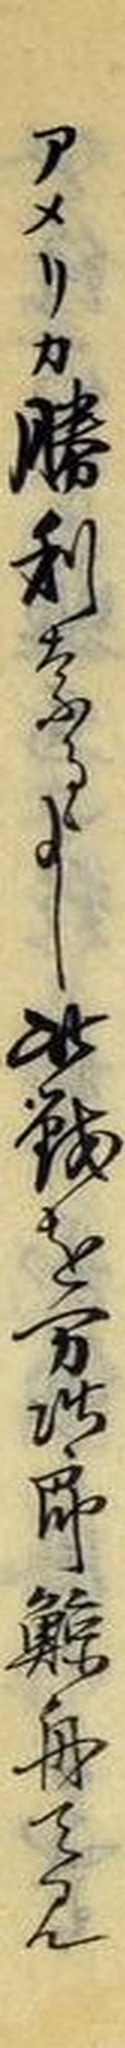アメリカ勝利なるよし此戦を万次郎鯨舟て見
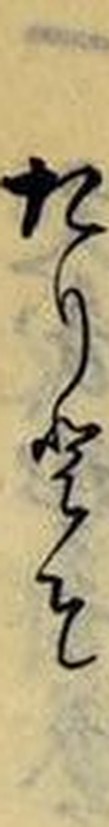たりとそ

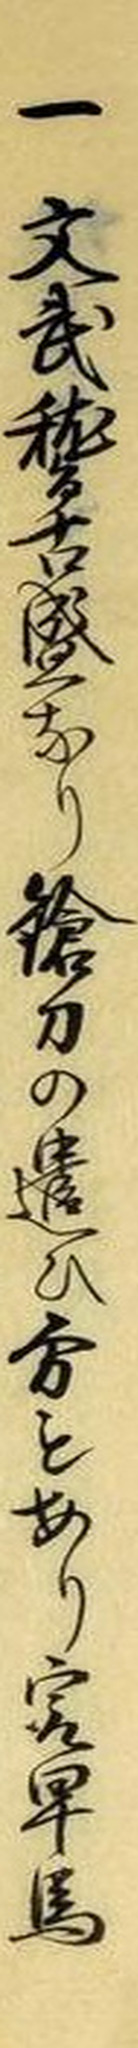一文武稽古盛なり槍刀の遣ひ方もあり最早馬
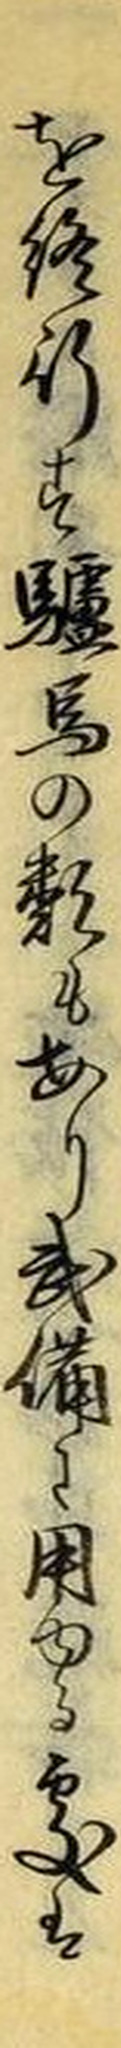を絡行す驢馬の類もあり武備に用ゆる處は
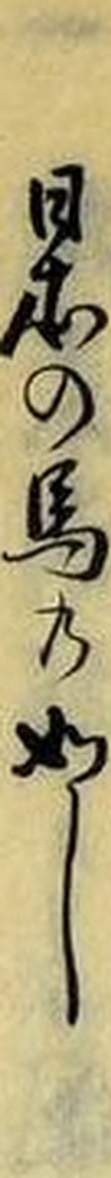日本の馬の如し
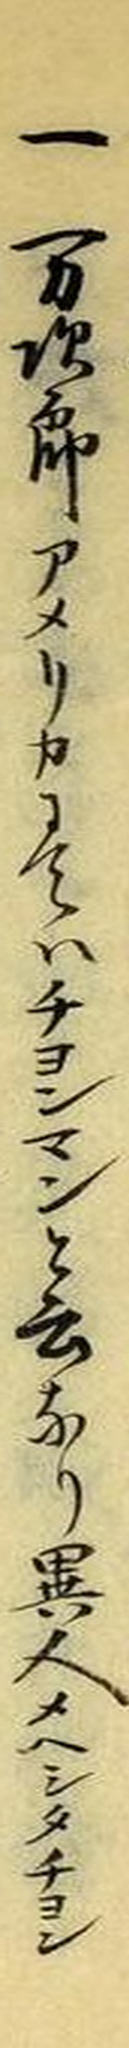一万次郎アメリカにてハチヨンマンと云なり異人メへシタチヨン
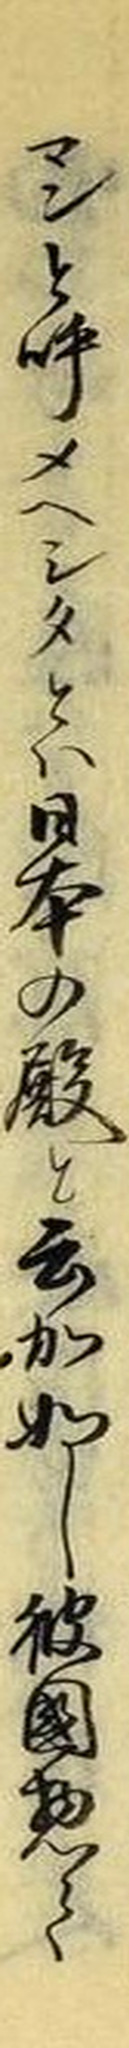マンと呼メへシタとハ日本の殿と云が如し彼国惣て
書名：漂客談奇（備考雑録写8）
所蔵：福井県文書館 Fukui Prefectural Archives
